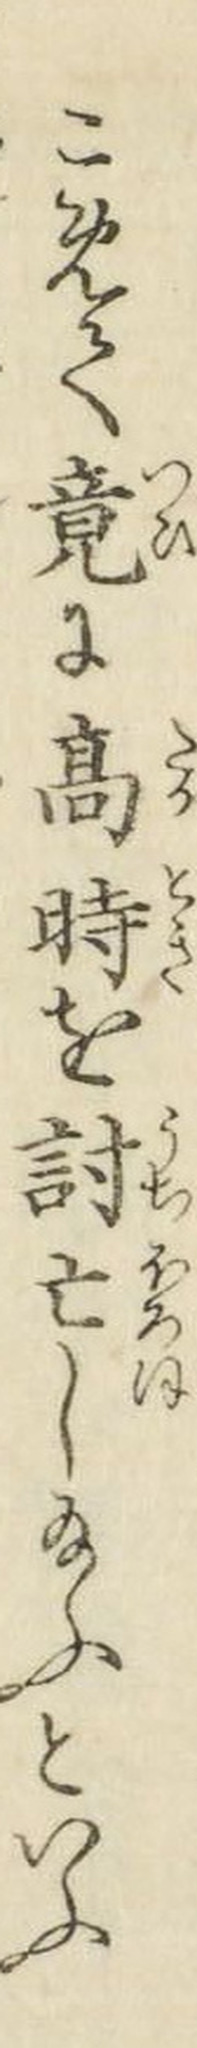こめて竟に高時を討亡し給ふといふ
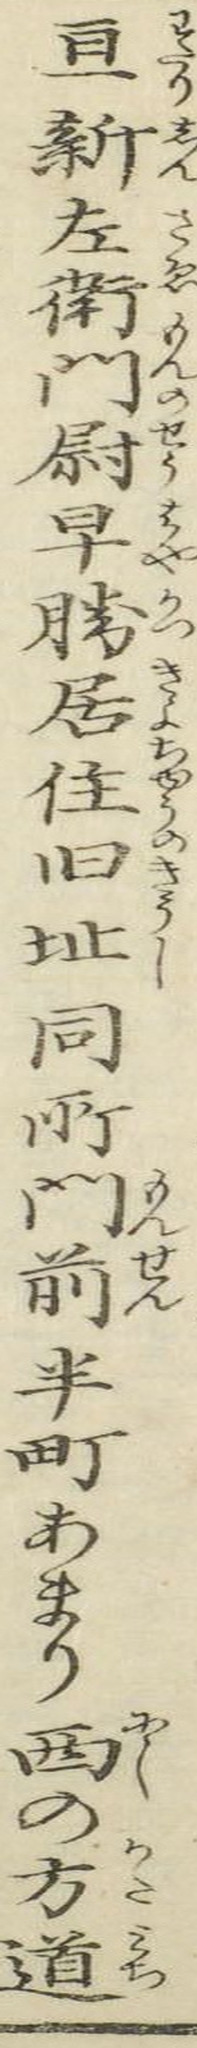亘新左衛門尉早勝居住旧址同所門前半町あまり西の方道
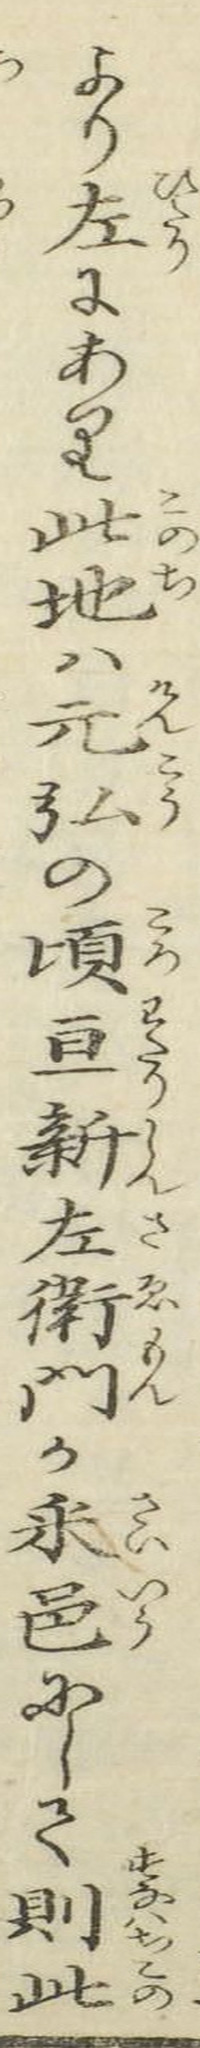より左にあり此地は元弘の頃亘新左衛門か采邑にして則此
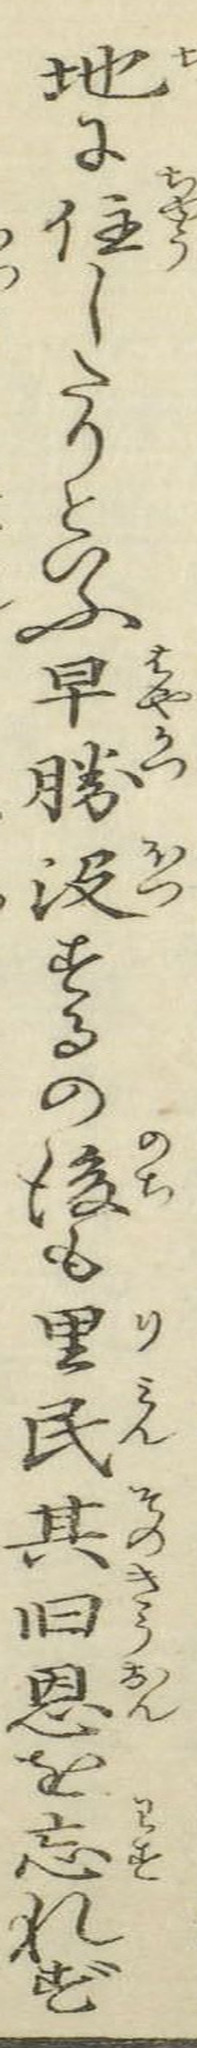地に住したりといふ早勝没するの後も里民其旧恩を忘れず
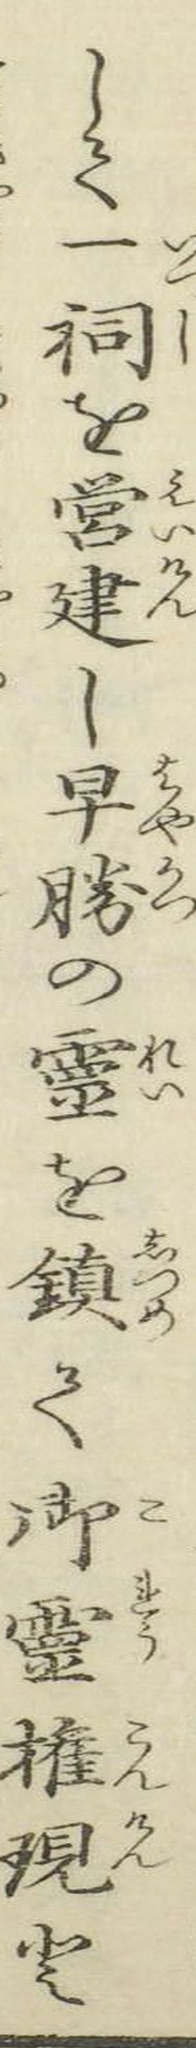して一祠を営建し早勝の霊を鎮て御霊権現と
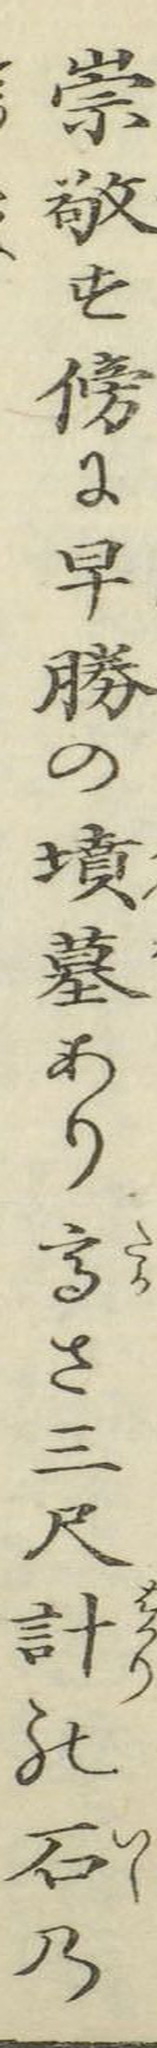崇敬す傍に早勝の墳墓あり高さ三尺計の石の
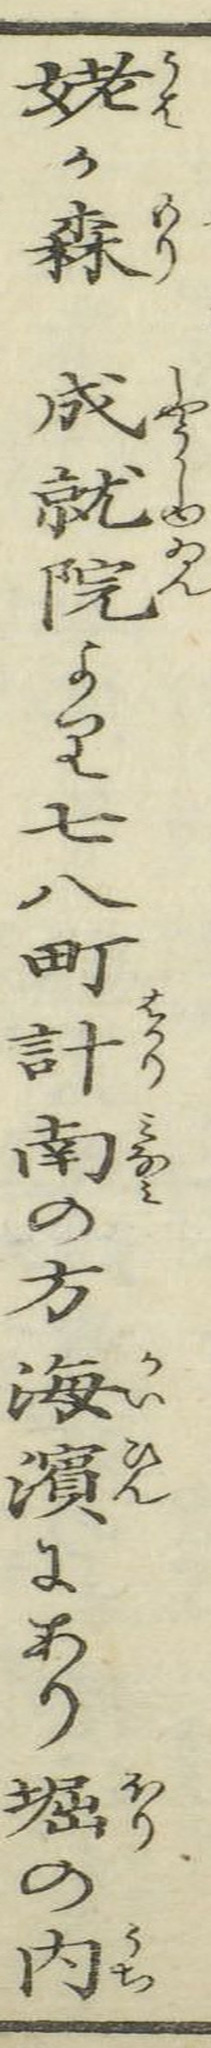姥ゕ森成就院より七八町計南の方海濵にあり堀の内
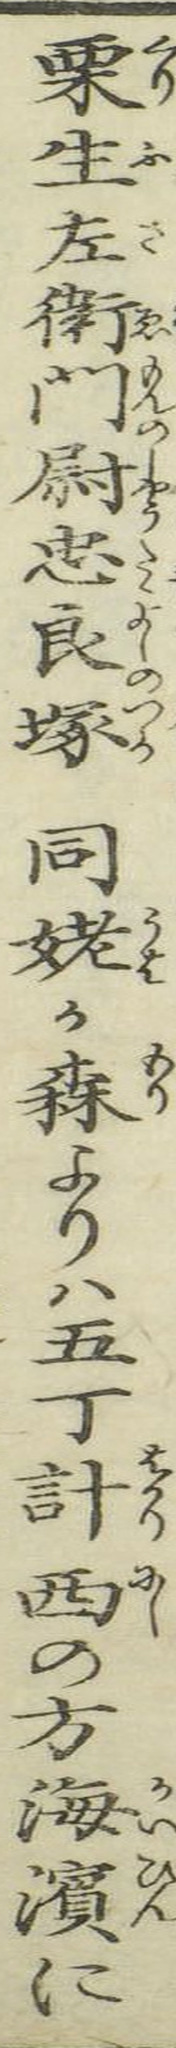栗生左衛門尉忠良塚同姥ゕ森よりは五丁計西の方海濵に

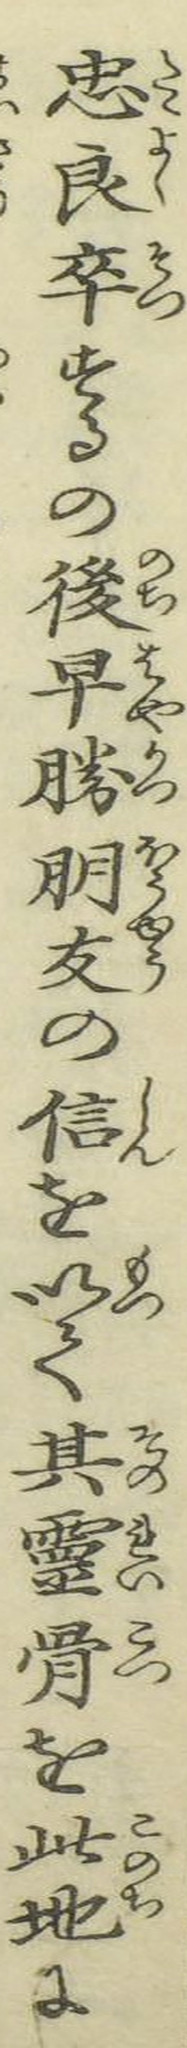忠良卒するの後早勝朋友の信を以て其霊骨を此地に
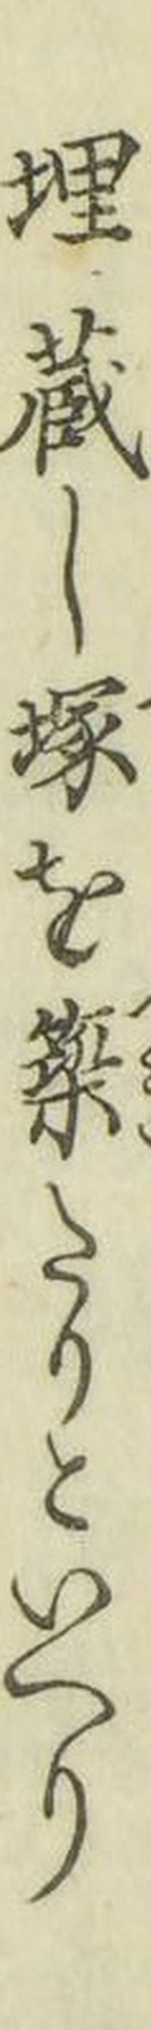埋蔵し塚を築たりといへり
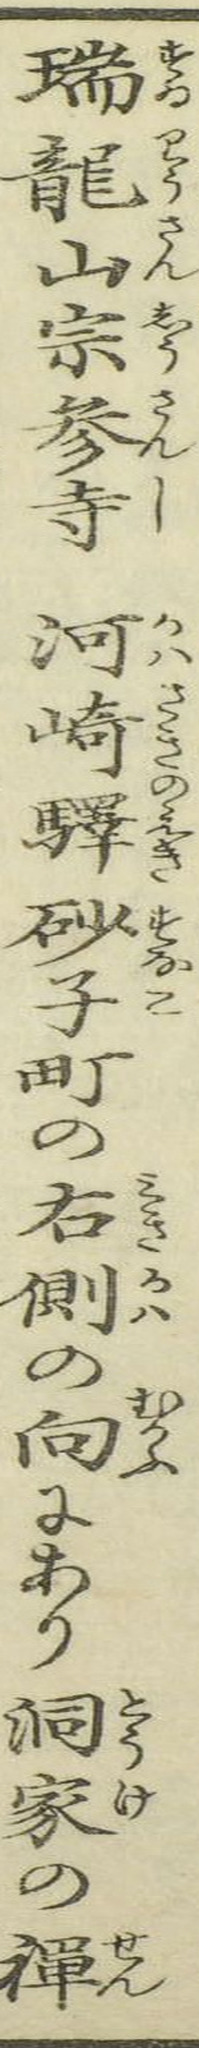瑞龍山宗参寺河崎驛砂子町の右側の向にあり洞家の禅
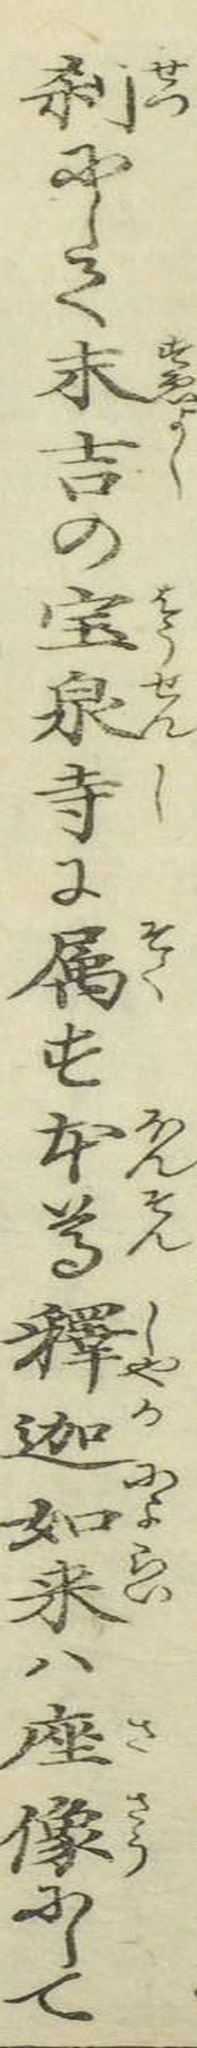刹にして末吉の宝泉寺に属す本尊釋迦如来は座像にして
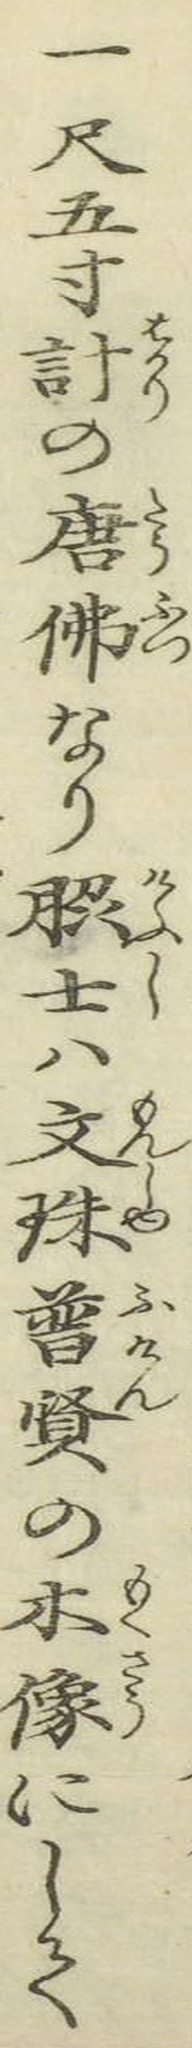一尺五寸計の唐佛なり脇士は文珠普賢の木像にして
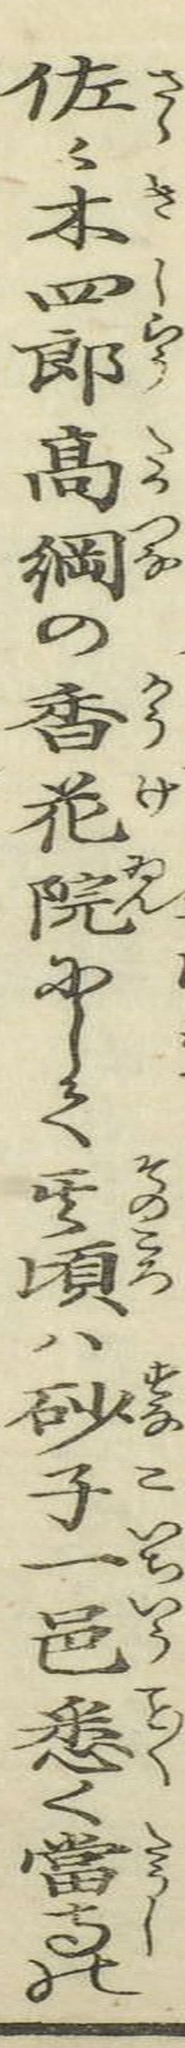佐々木四郎高綱の香花院にして其頃は砂子一邑悉く當寺の
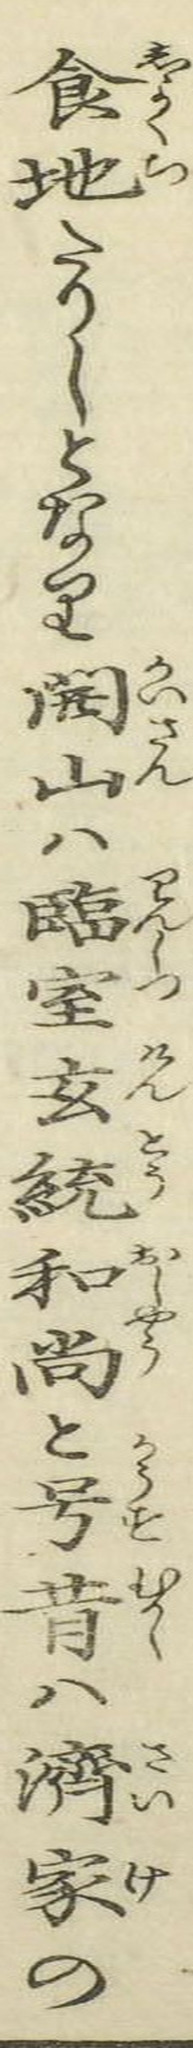食地たりしとなり開山は臨室玄統和尚と号昔は濟家の
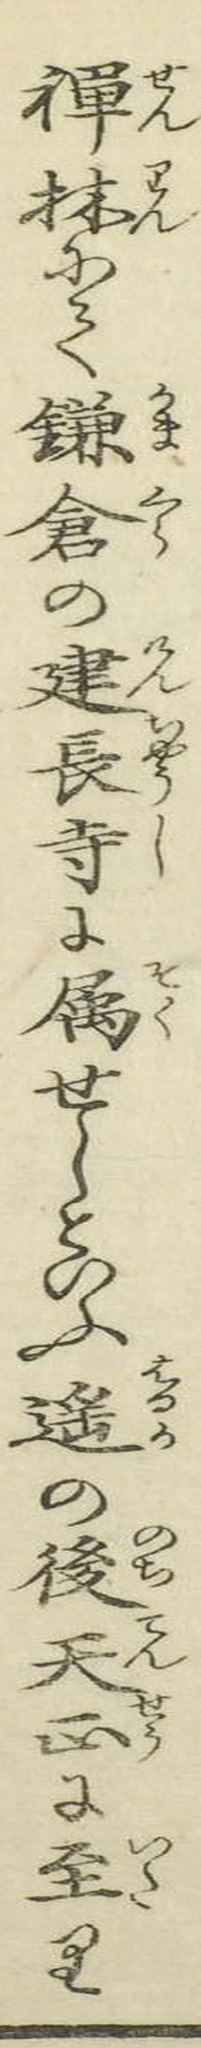禅林にて鎌倉の建長寺に属せしといふ遥の後天正に至り
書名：江戸名所図会 20巻 巻之5
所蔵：東京学芸大学教育コンテンツアーカイブ
